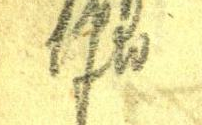172
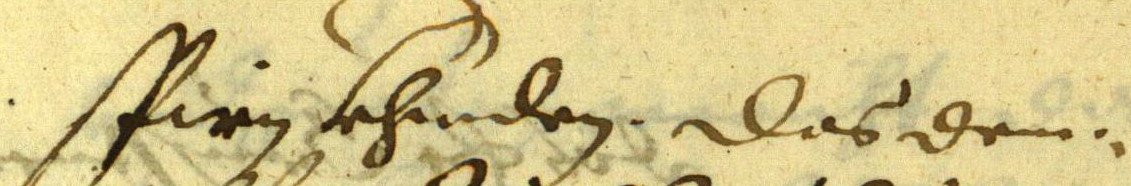spirn khinden. das den¬
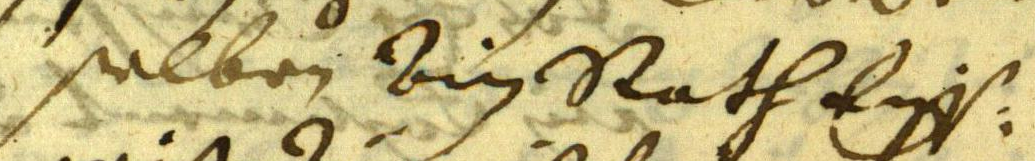selben Ain Rath Eiss¬
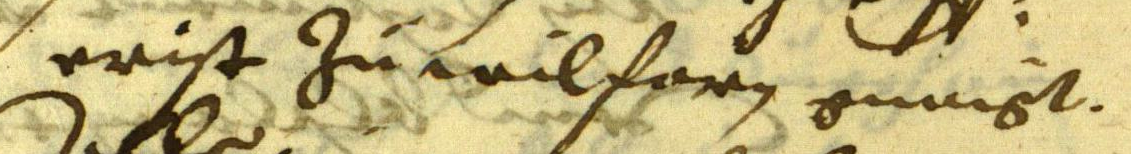erist Zū wilfarn gnaigt.
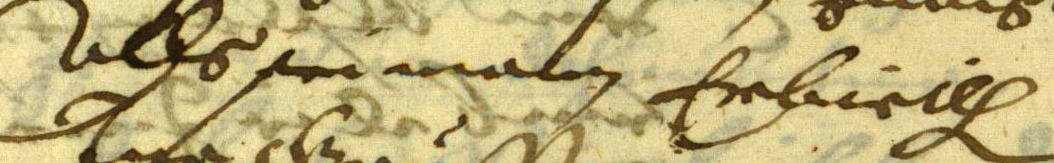Alls sei mann Erbietl
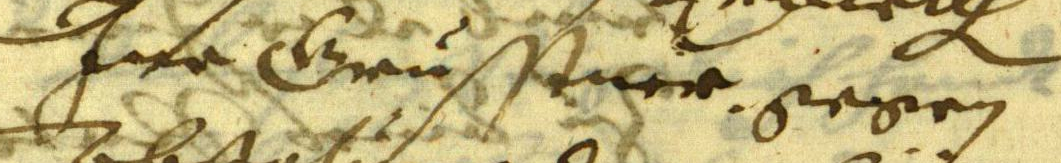Ine Grūsstner. gegen
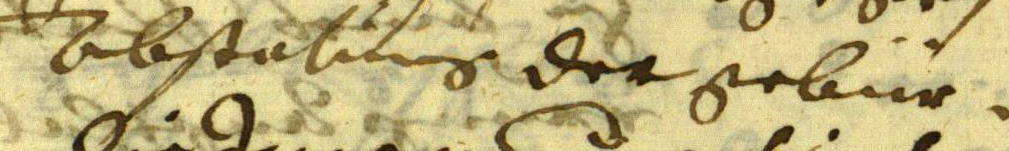Abstatūng der gebür.
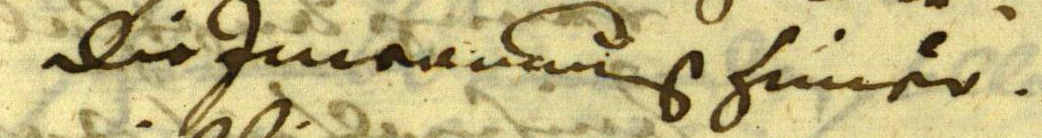die Inwonūng Zūver¬
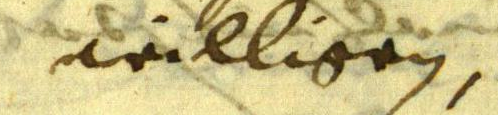willigen,
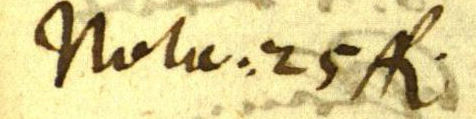Nota: 25 fl.
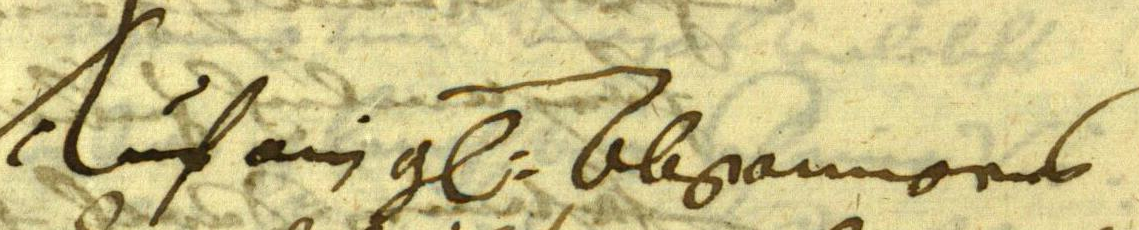Aūf ain g: Abganngens
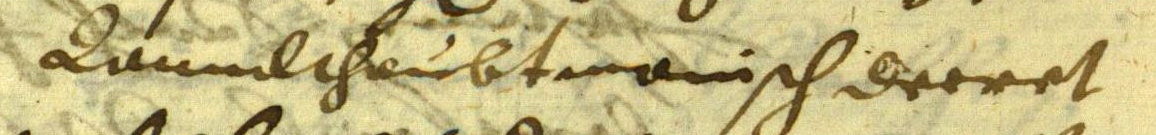Lanndthaūbtmannisch decret
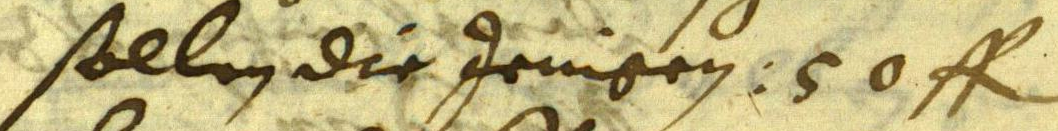sollen die Jenigen: 50 fl
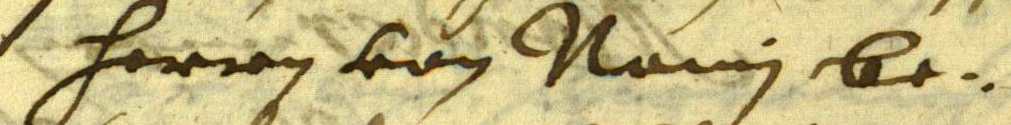herrn von Nomi be¬
